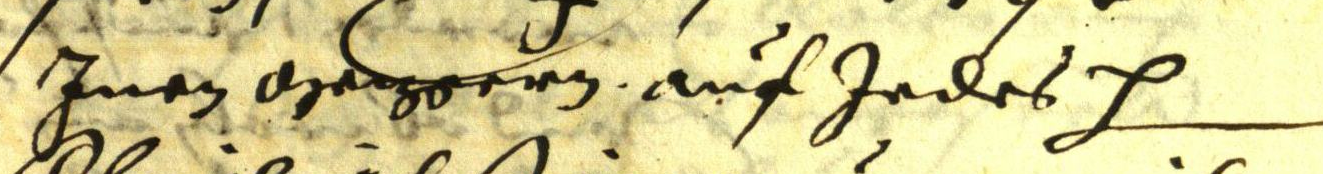Inen Mezgern. aūf Jedes L
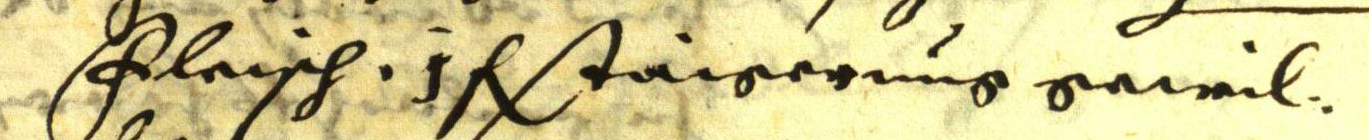fleisch. 1 fl staigerūng gewil¬
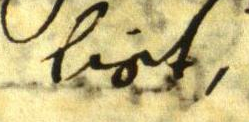ligt,
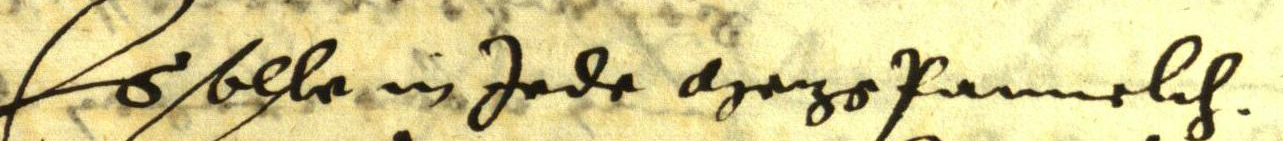Es solle in Jede Mezg Pannckh
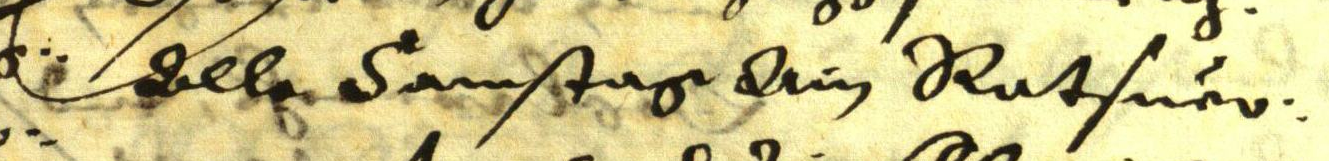Alle Samstag Ain Ratsver¬
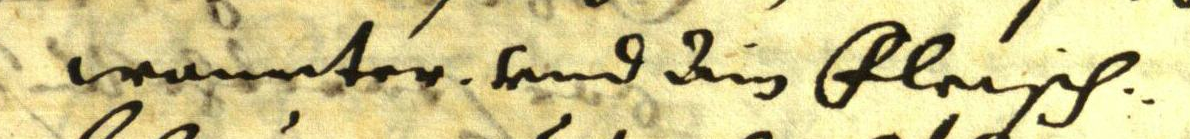wannter. vnd Ain Fleisch¬
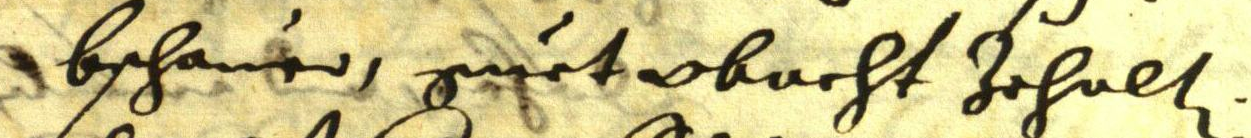bschaūer, gūet obacht Zehalt,
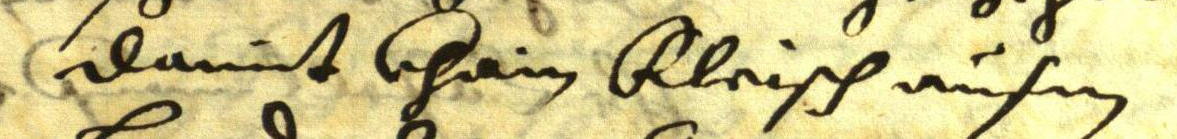damit khain fleisch aūsm
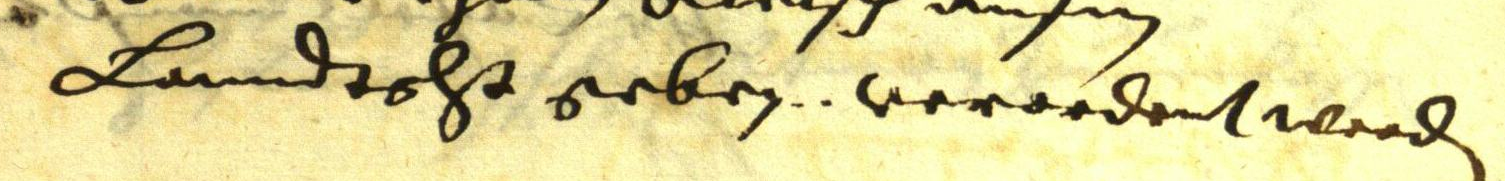Lanndtght geben.. verordent werd
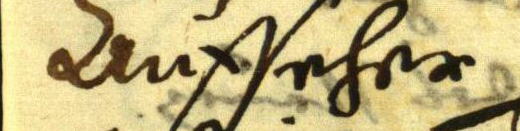Aūfseher
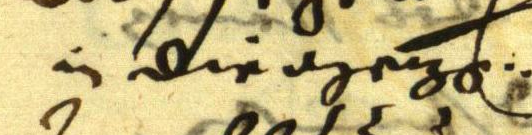in die Mezg¬
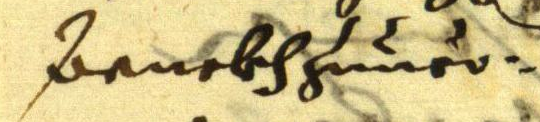Penckh Zūūer¬
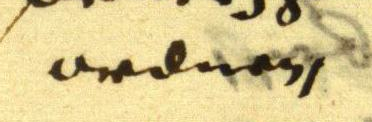ordnen,
